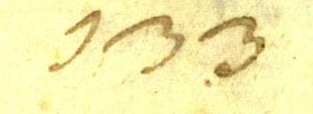133
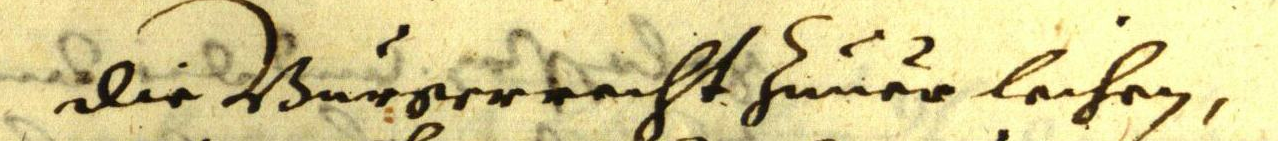die Būrgerrecht Zūūer leihen,
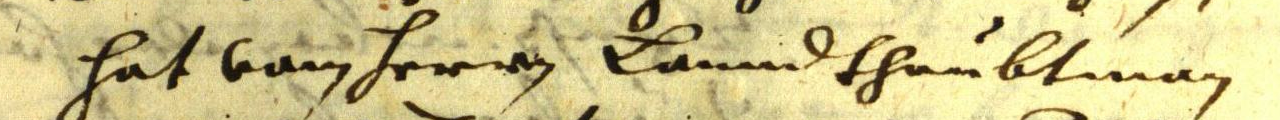hat vom herrn Lanndthaūbtman
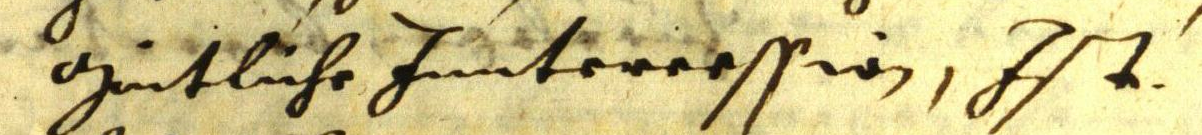Mintliche Inntercession, Ist.
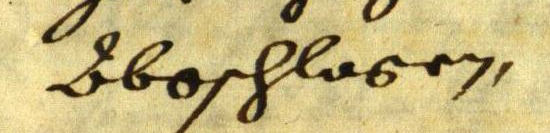Abgschlagen,
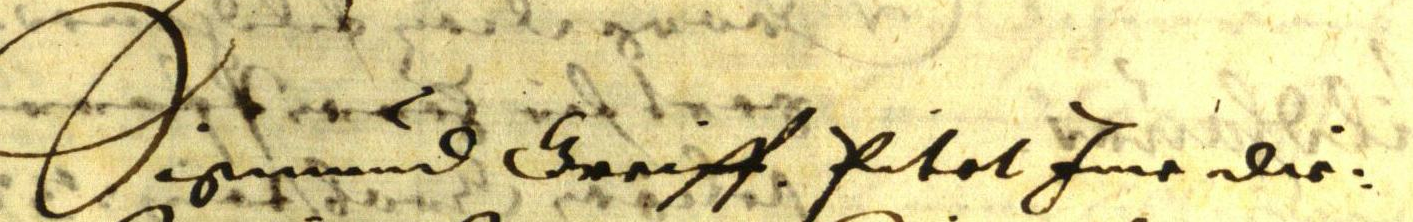Sigmūnd Greiff Pitet Ime die:
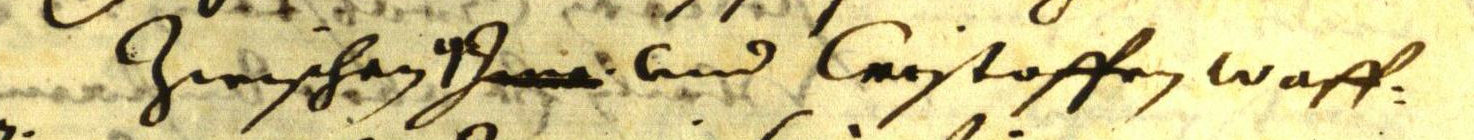Zwischen Ime. vnd Cristoffen Waff¬
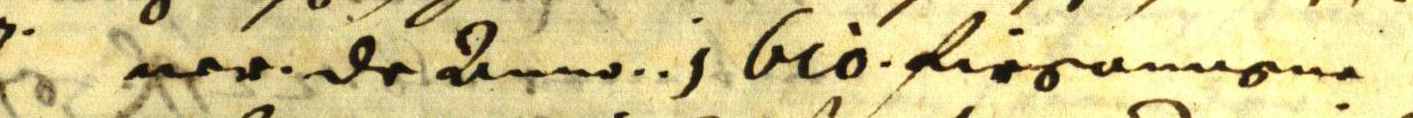ner. de Anno: 1610. firganngne
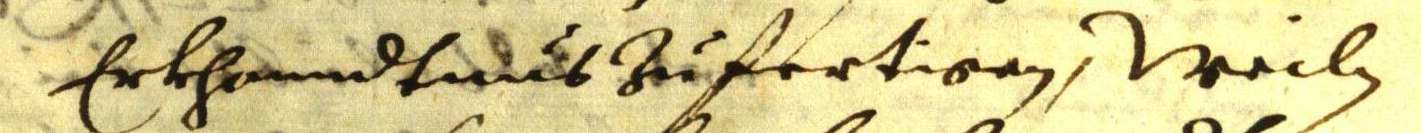Erkhonndtnūs Zūfertigen, Weiln
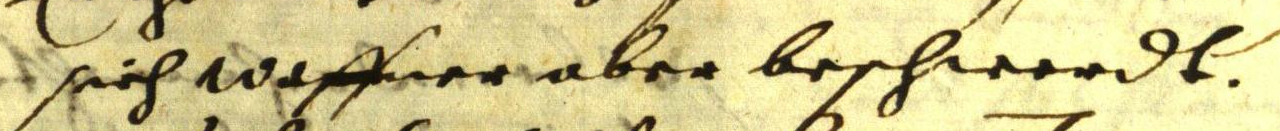Sich Waffner aber bschwerdt.
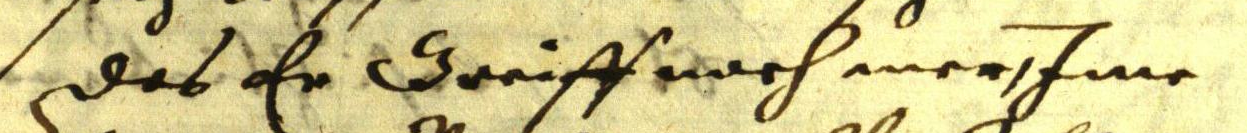das Er Greiff noch mer, Ime
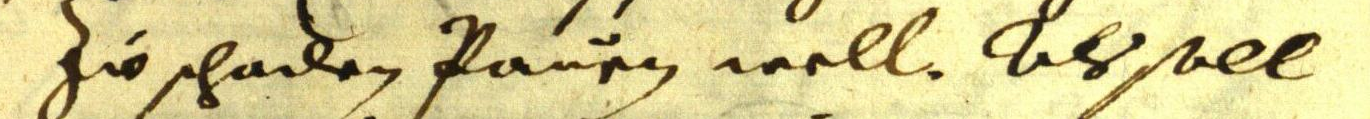Zū schaden Paūen well. Als soll
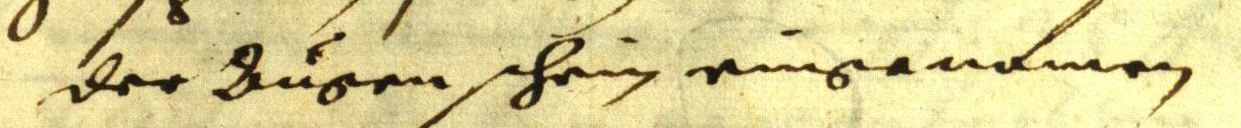der Aūgen schein eingenomen
